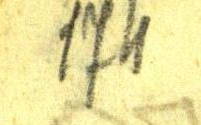174
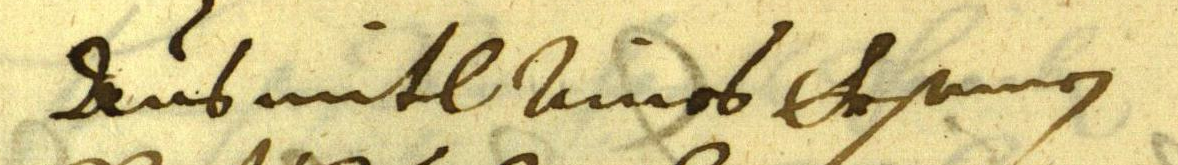Aūs mitl Aines Ersamen
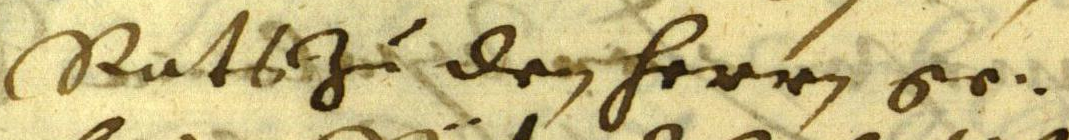Rats Zū den herrn ge¬
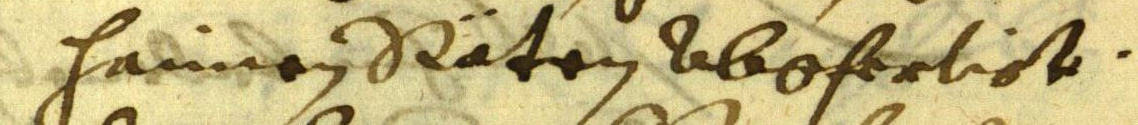haimen Räten Abgfertigt.
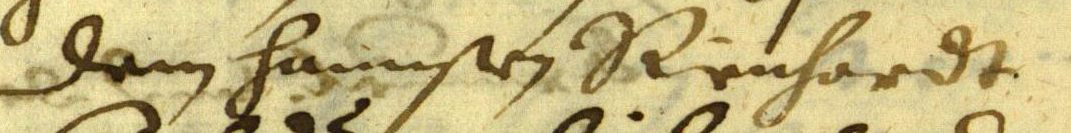dem hannsen Reichardt
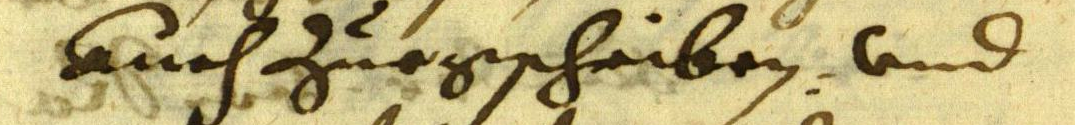aūch Zūegschriben. vnd
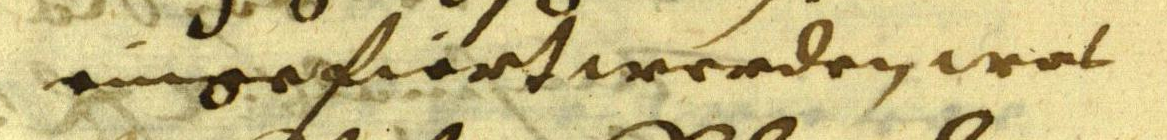eingefiert werden was
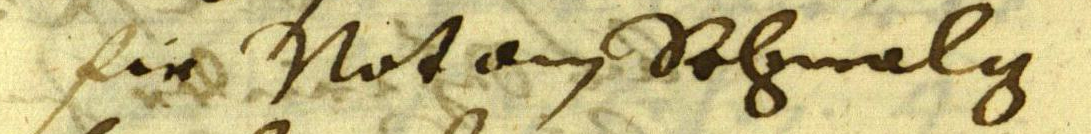fir Not am Schmalz
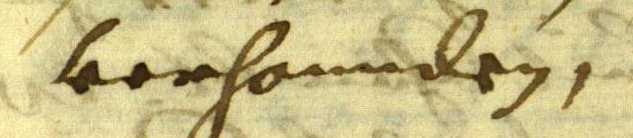verhannden,
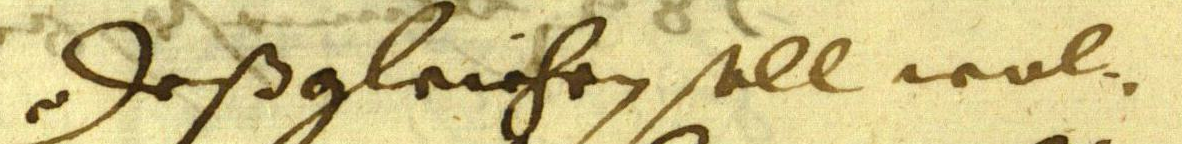Deßgleichen soll wol¬
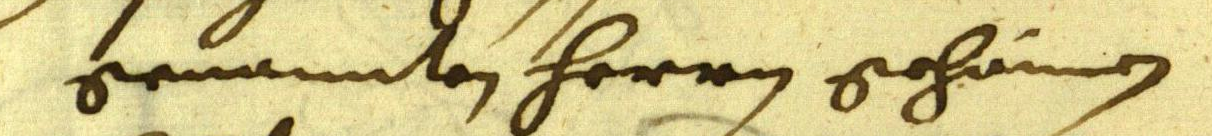genannten herrn gehaimen
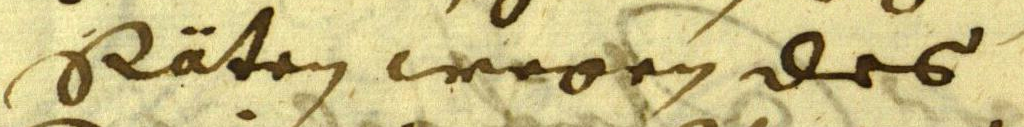Räten wegen des
